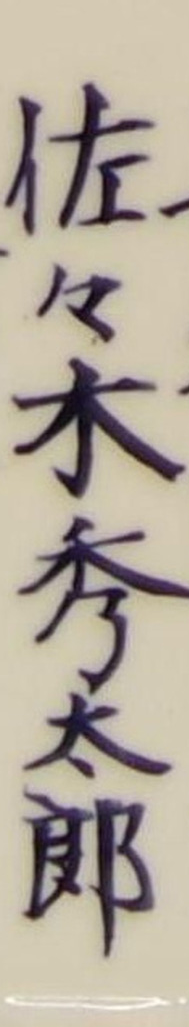佐々木秀太郎
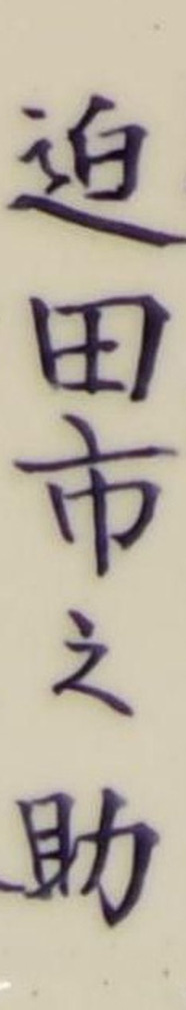迫田市之助
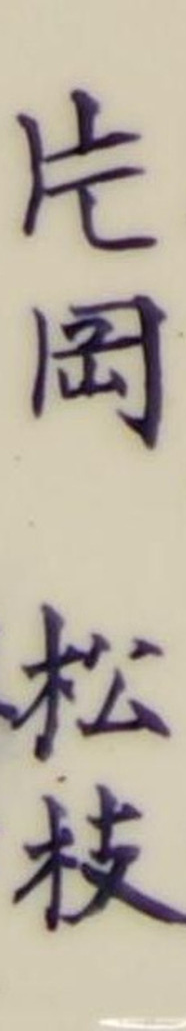片岡松枝
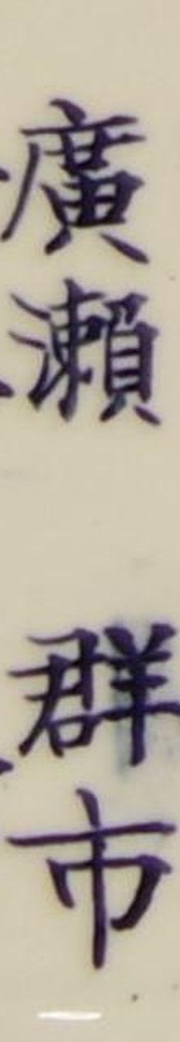廣瀬群市
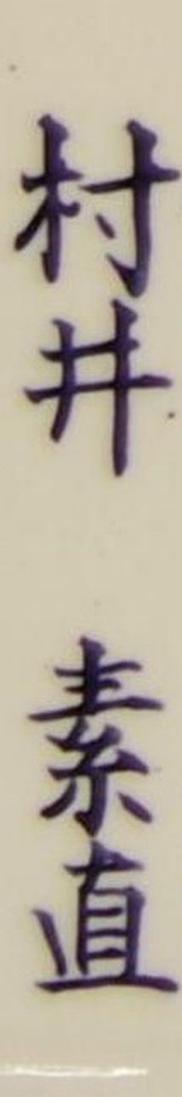村井素直

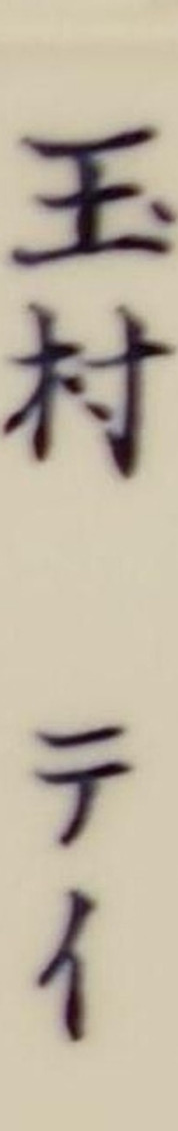玉村テイ
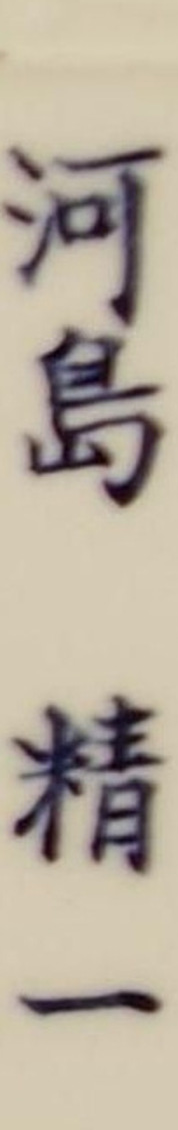河島精一
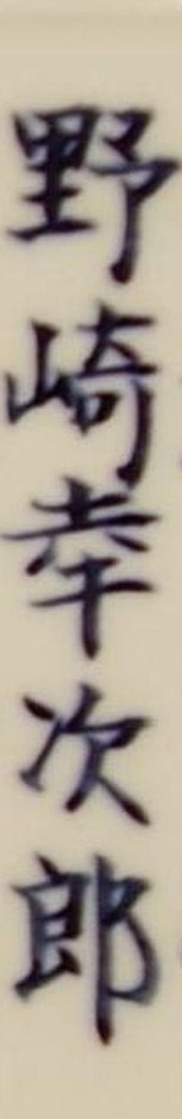野崎幸次郎
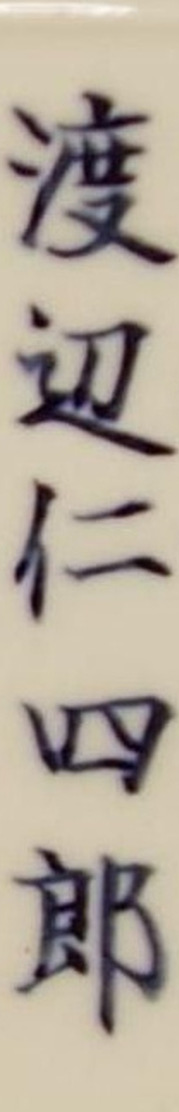渡辺仁四郎
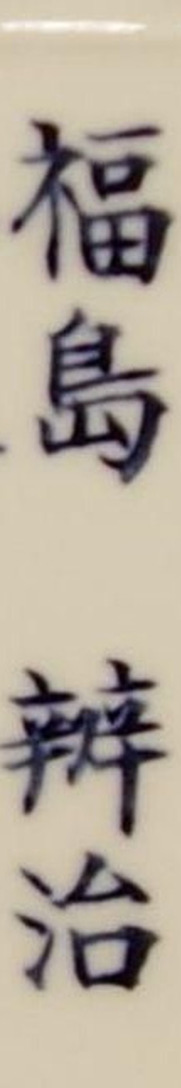福島辨治
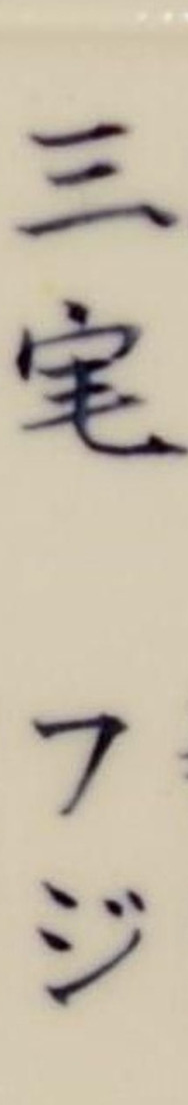三宅フジ
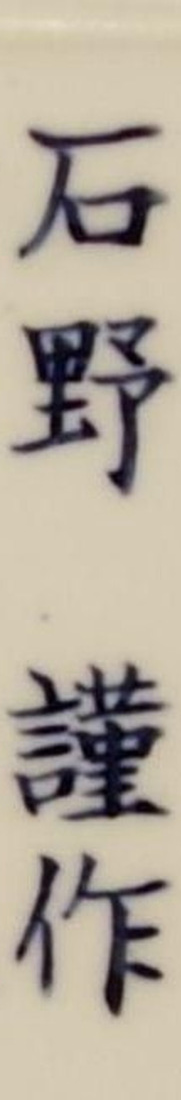石野謹作
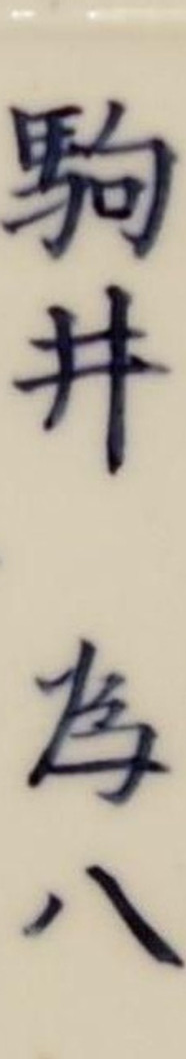駒井為八
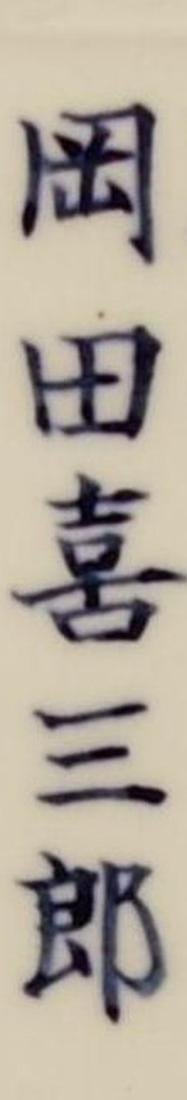岡田喜三郎
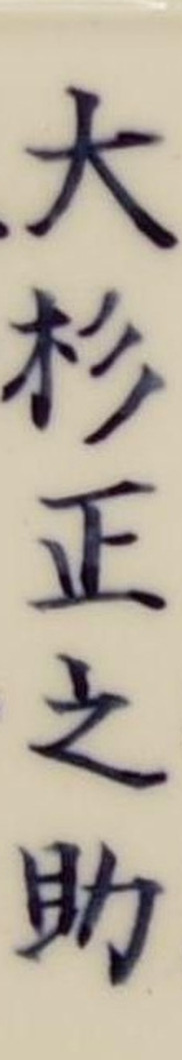大杉正之助
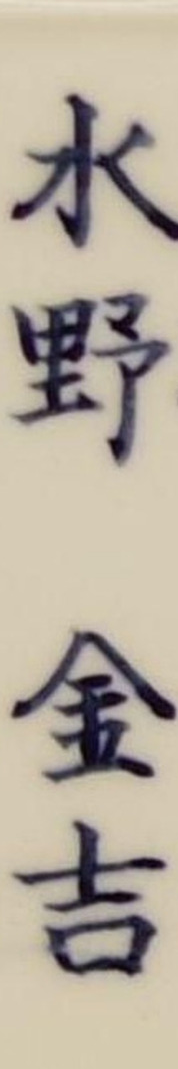水野金吉
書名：E~L
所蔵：高野山金剛峯寺
